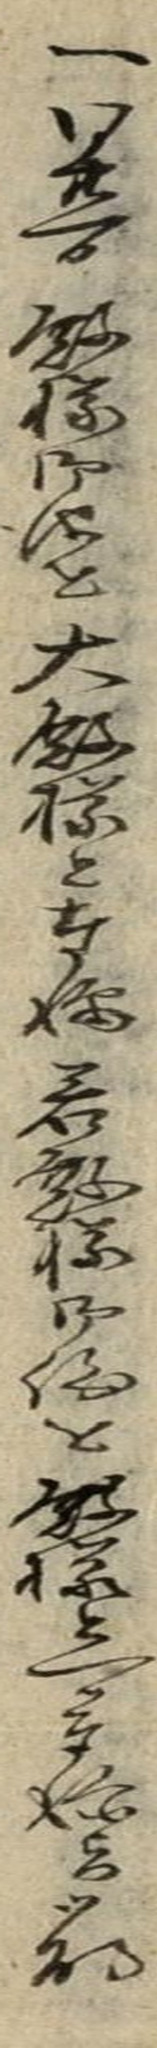一同廿一日殿様御儀を大殿様と奉称若殿様御儀を殿様と可奉称旨御触
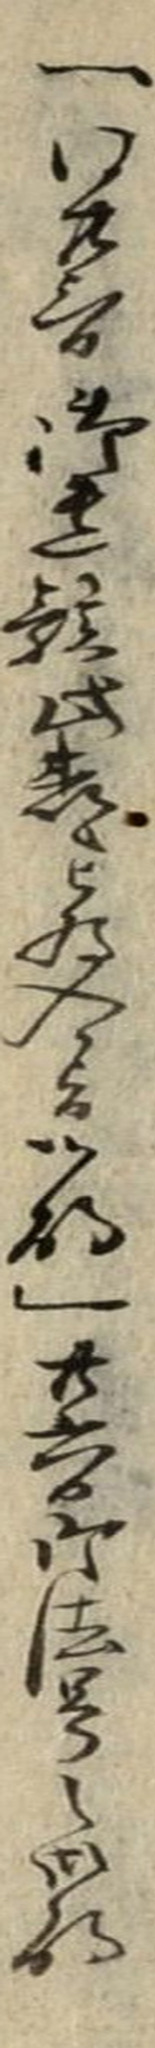一同廿三日御遺骸此表へ被為入候旨御触」廿六日御法号之御触
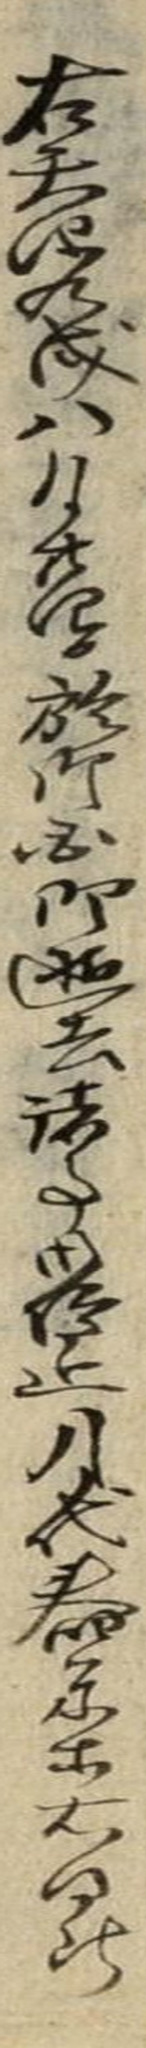右天保九戌八月廿四日於御国御逝去諸事御停止月代舂米等右同断
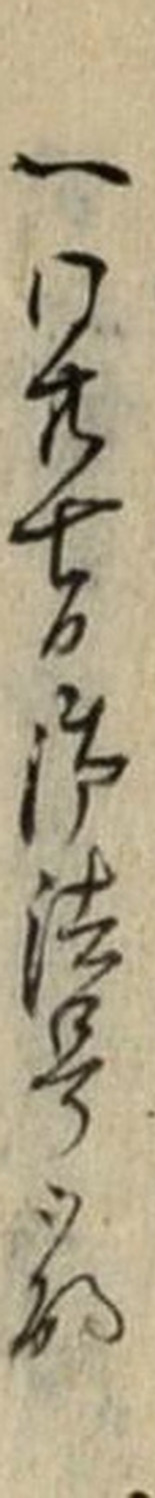一同廿七日御法号御触
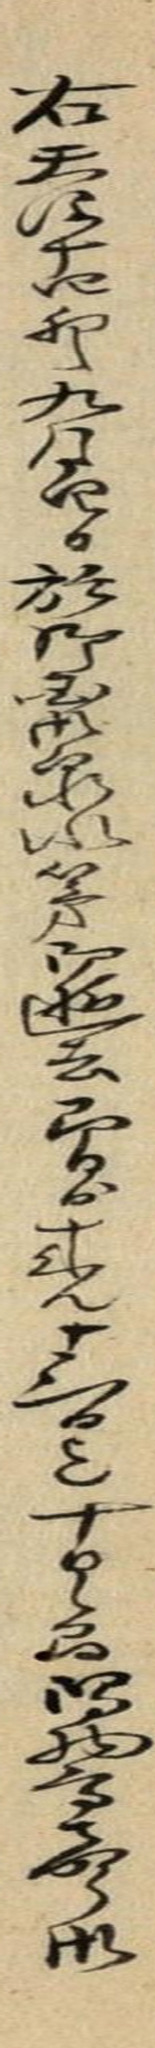右天保十四卯九月四日於御国御泉水第御逝去即日ゟ来ル十三日迄十日之間鳴物高声御
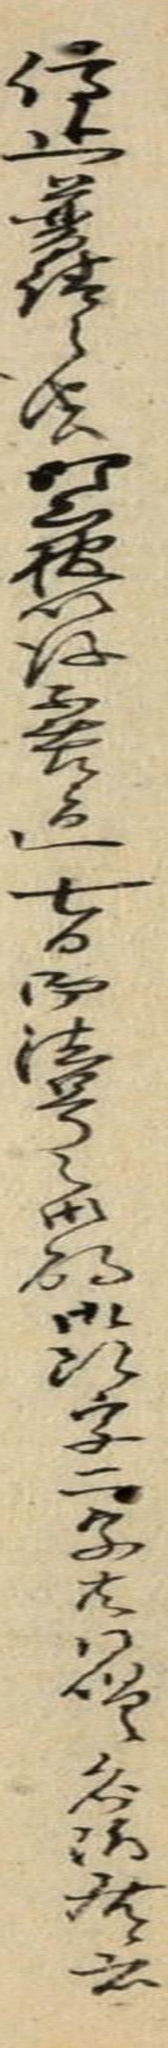停止普請之儀ハ御出棺以後不苦旨」七日御法号之御触御頭字二字共同唱之名附居候者
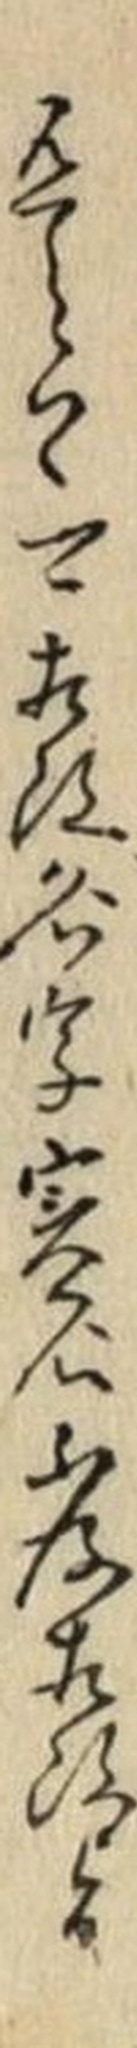有之候はゝ可相改名字実名不及相改旨
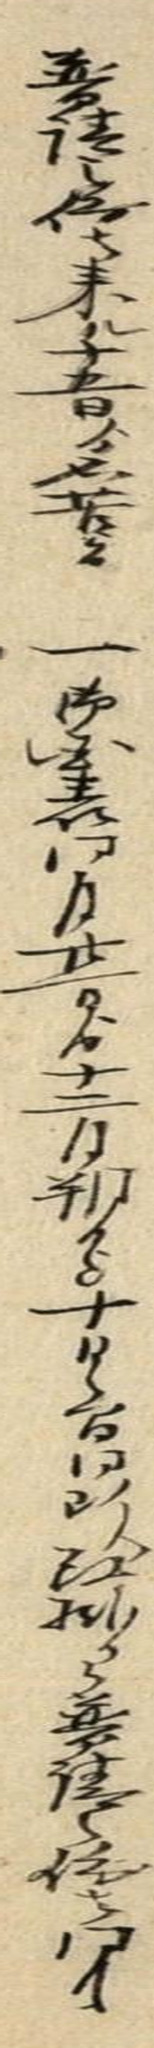普請之儀は来ル十五日ゟ不苦旨一御国表同月廿一日ゟ十二月朔日迄十日之間同断致掛り候普請之儀は同月
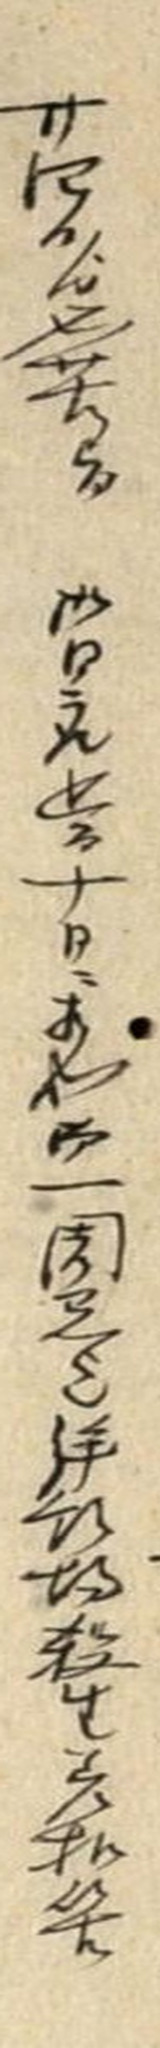廿四日ゟ不苦旨御日取追て十日に相成御一周忌迄拝領場殺生差控筈
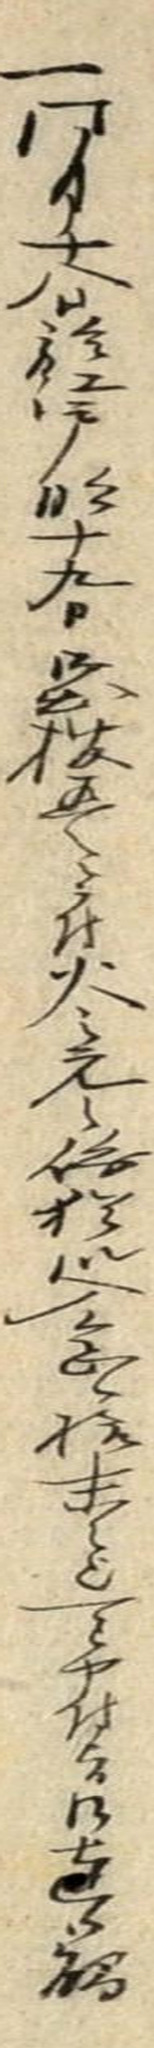一同月十八日於江戸明十九日御出棺有之候に付火之元之儀猶以入念候様末々迄可申付旨御達御触
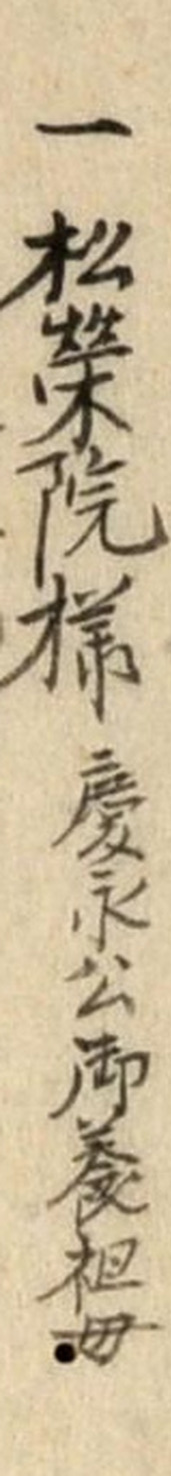一松栄院様慶永公御養祖母
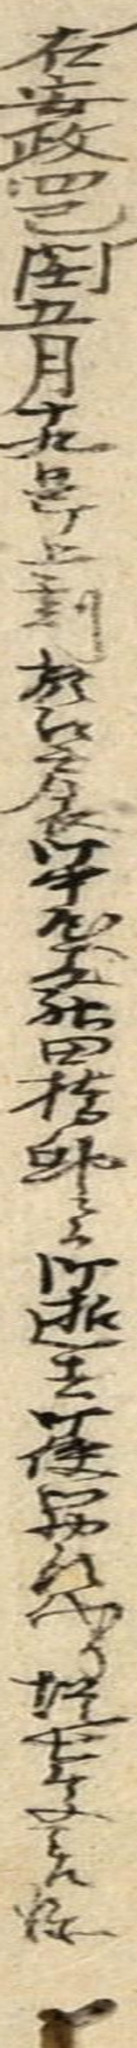右安政四巳閏五月十九日巳ノ上刻於江戸表御中屋敷神田橋邸にて御逝去御使筋頭代り堤七太夫差添
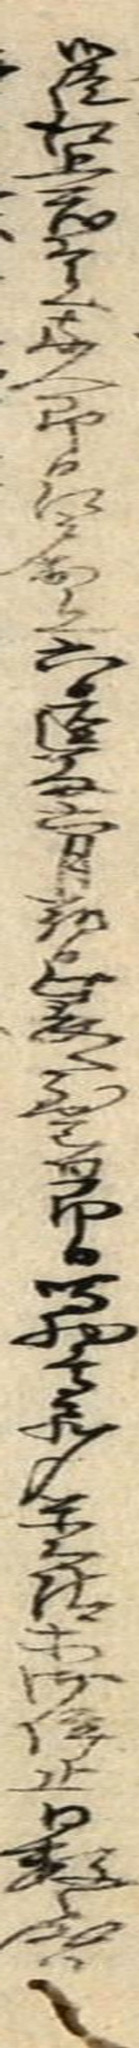御徒江上茂太夫両人即日江戸出立六日逗留六月朔日此表へ到着即日鳴物高声普請等御停止日数之儀は
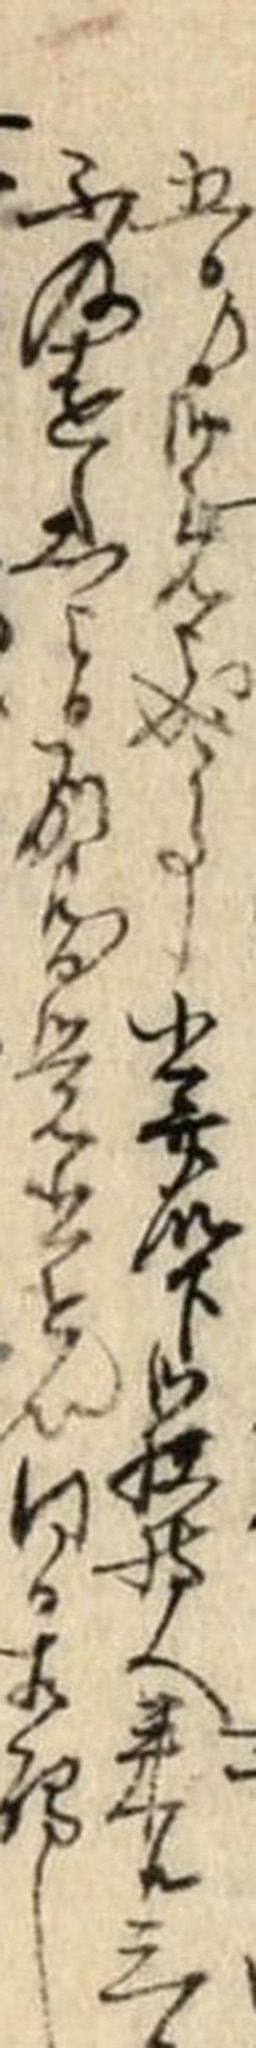不及遠慮旨別紙覚書を以同日相触之
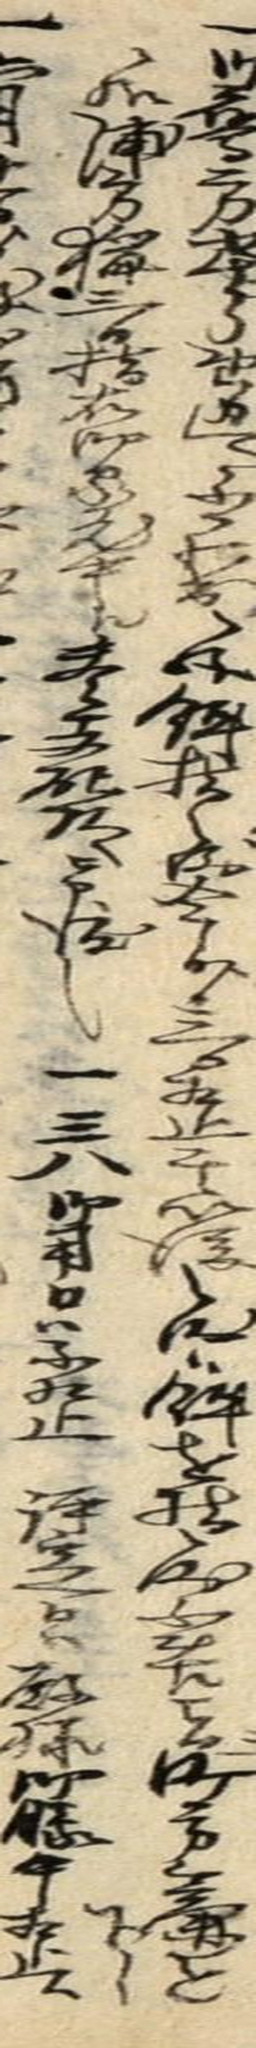候様浦方猟三日指右御家老中え夫々支配頭へ被申渡之一三八御用日は不相止評定日は殿様御朦中相止候
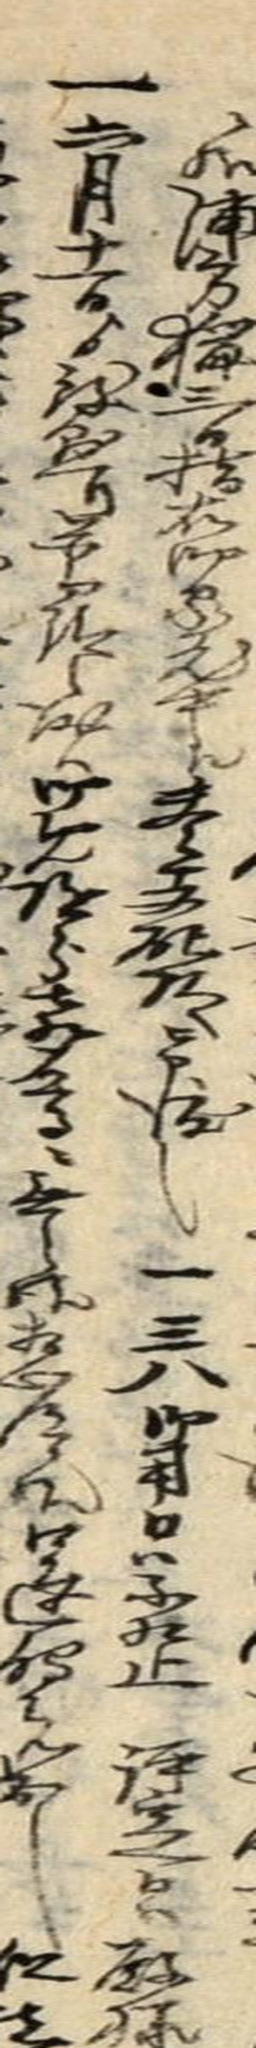一六月十一日ゟ致懸り普請之儀は御免随分高声に無之様相心得候様口達触差出之但諸殺生之儀は
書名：御停止異変死失
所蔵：福井県文書館 Fukui Prefectural Archives
